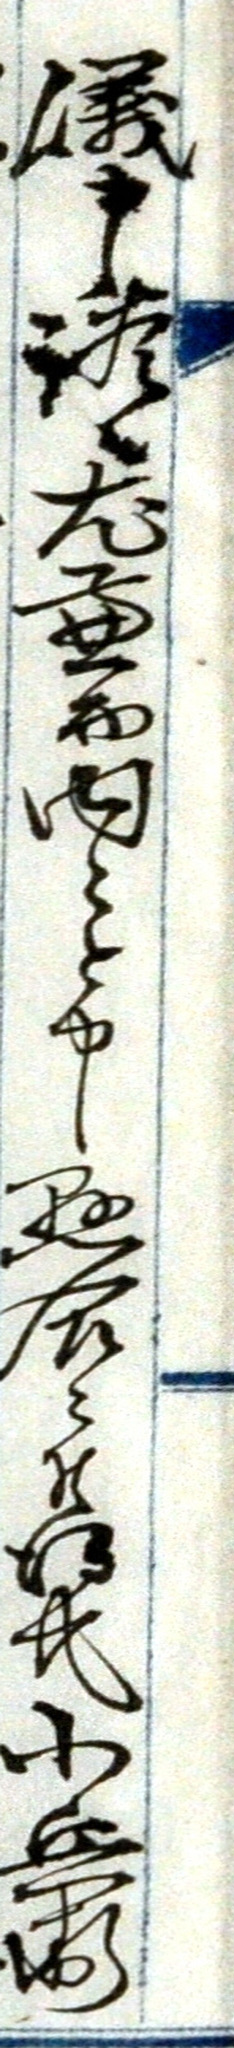儀申談候尤兼而内々と申懸合ニ候得共小兵衛
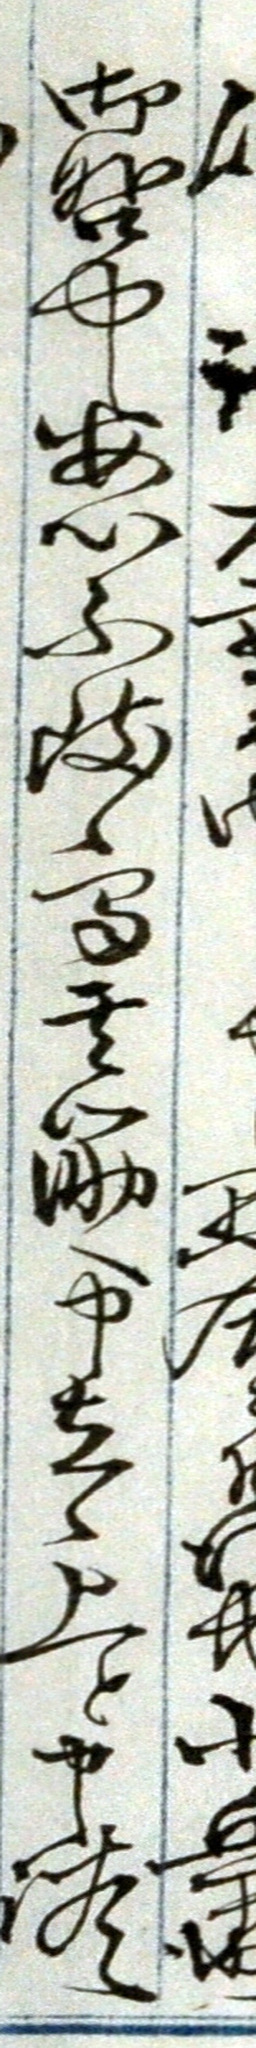御咎中安心不致候間其筋へ申立候上と申談
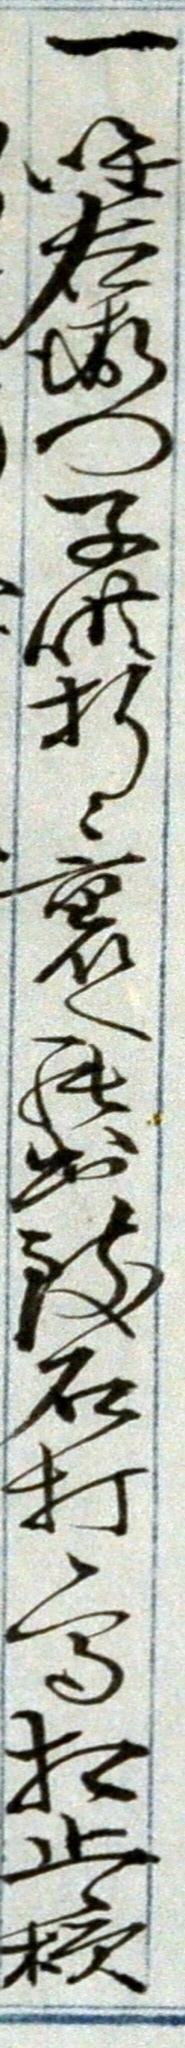一唯右衛門子供折々裏へ罷出致石打候間相止候様
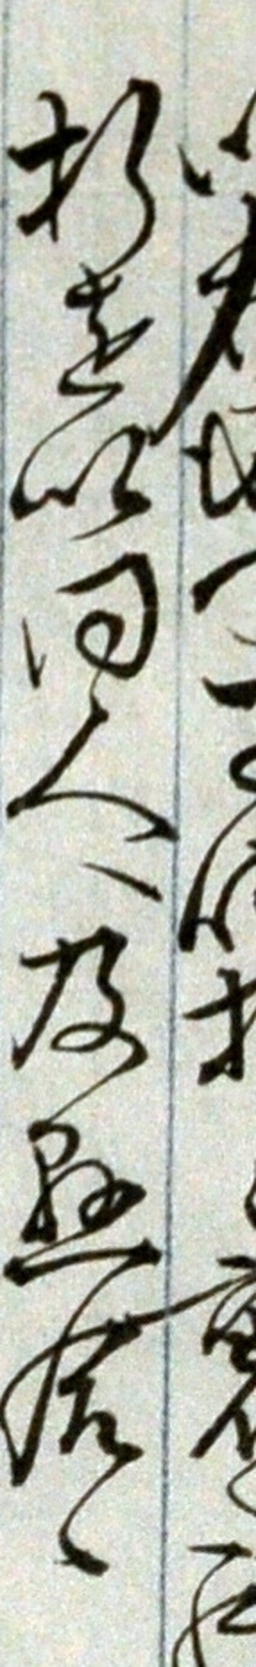折を以同人へ及懸合候
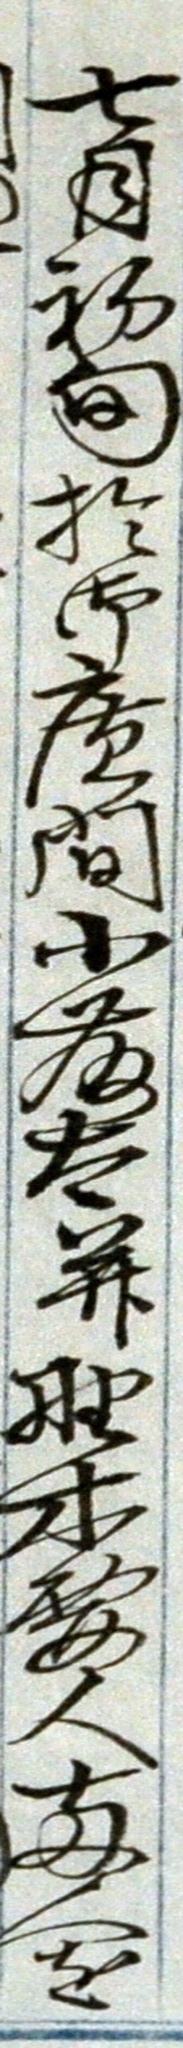一七月初旬於御広間小藤太幷野木要人両人を
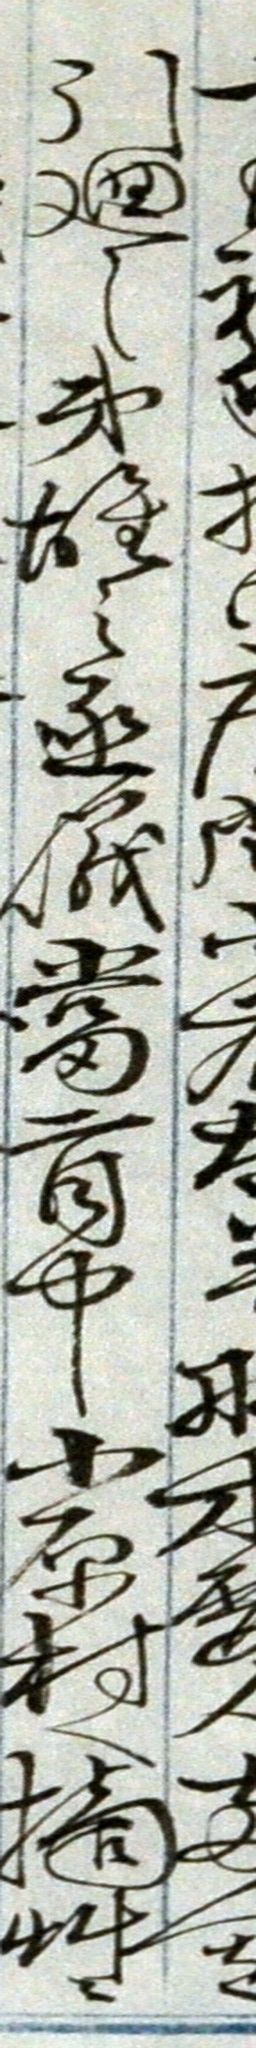引廻し弟雄之丞儀当二月中小原村へ摘草ニ
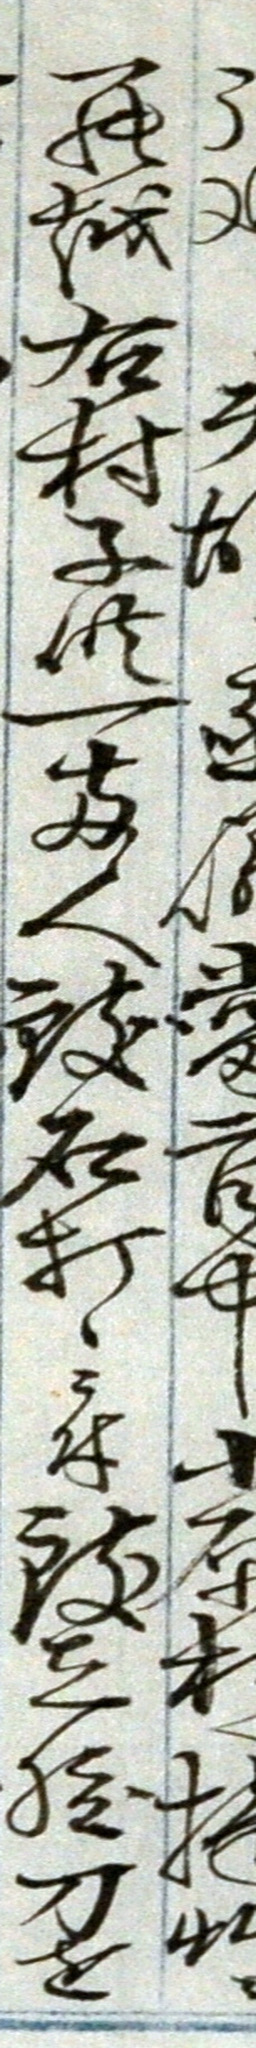罷越右村子供一両人致石打候ニ付致立腹刀を
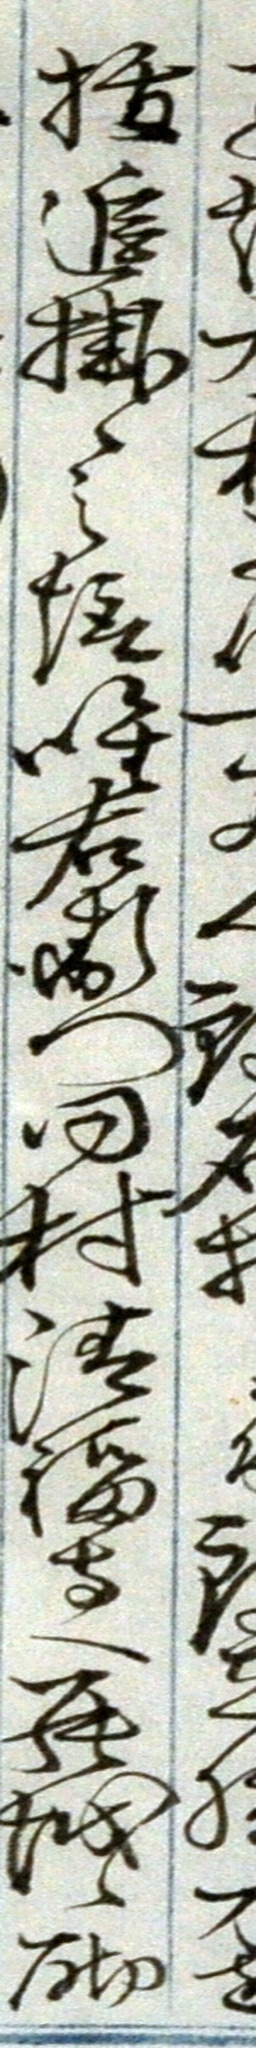抜追掛候之趣唯右衛門同村清福寺へ罷越候砌
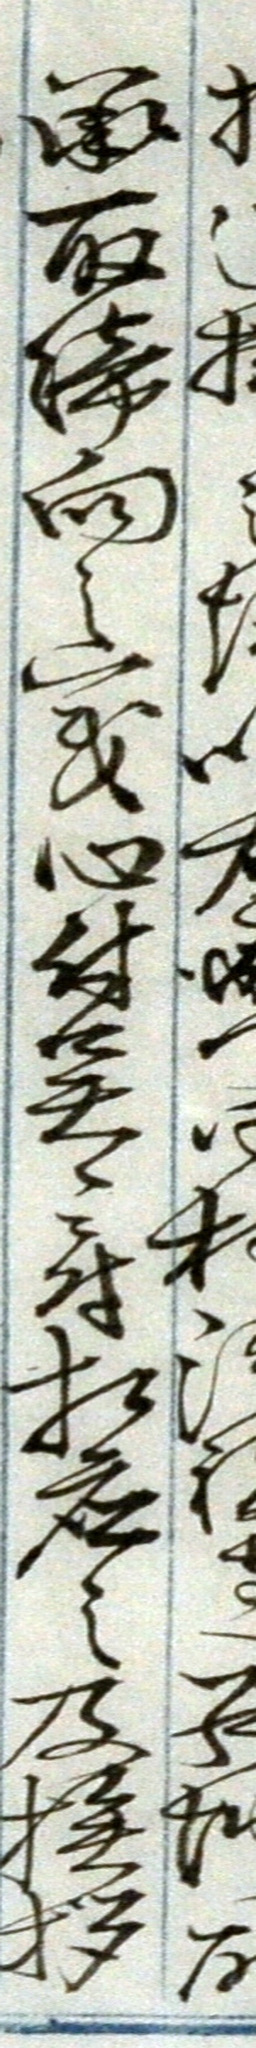承取締向之義心付呉候ニ付相応之及挨拶
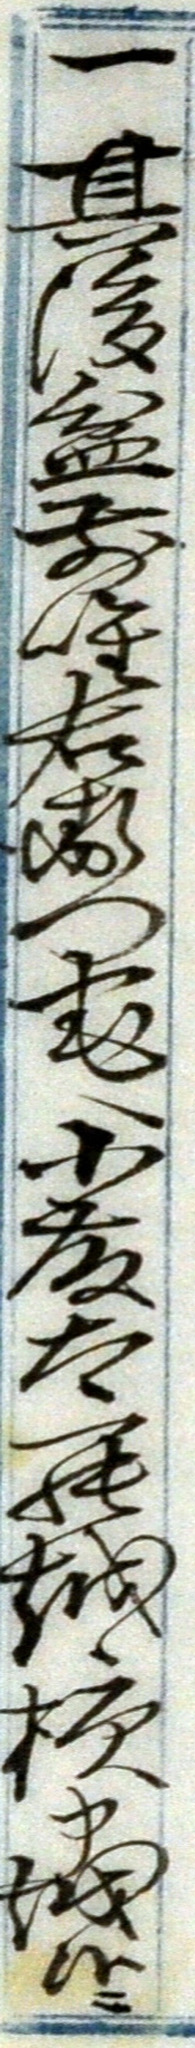一其後盆前唯右衛門宅へ小藤太罷越候様申越候ニ
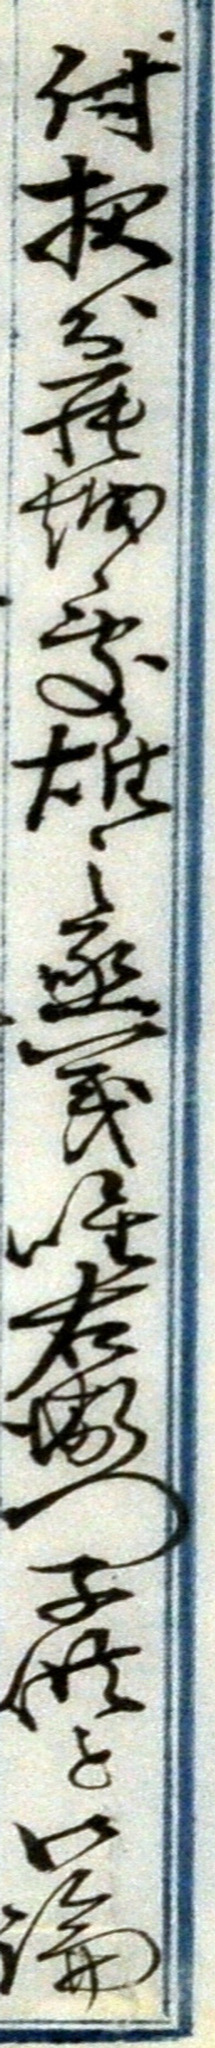付夜分罷越候處雄之丞義唯右衛門子供と口論
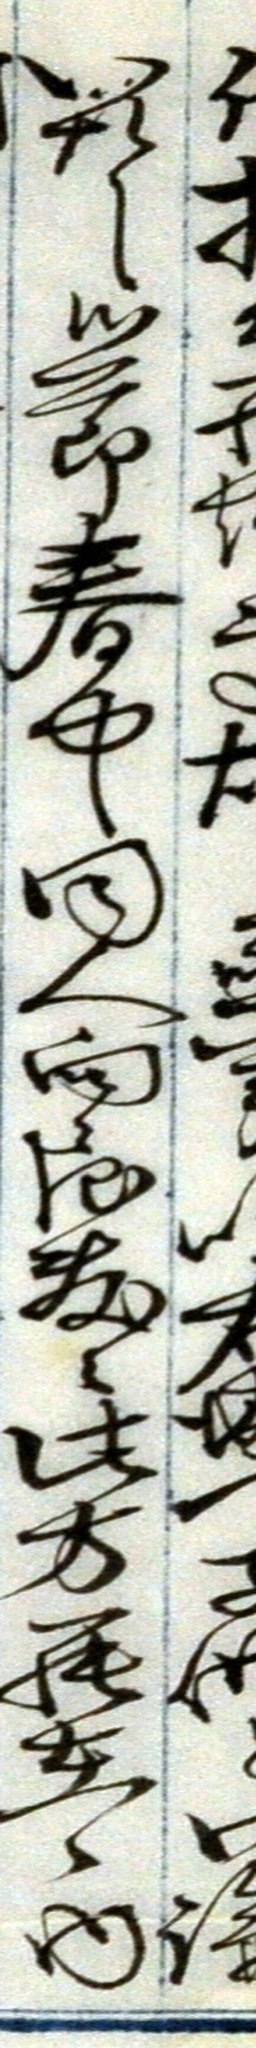いたし候節春中同人向屋敷ニ此方罷在候内
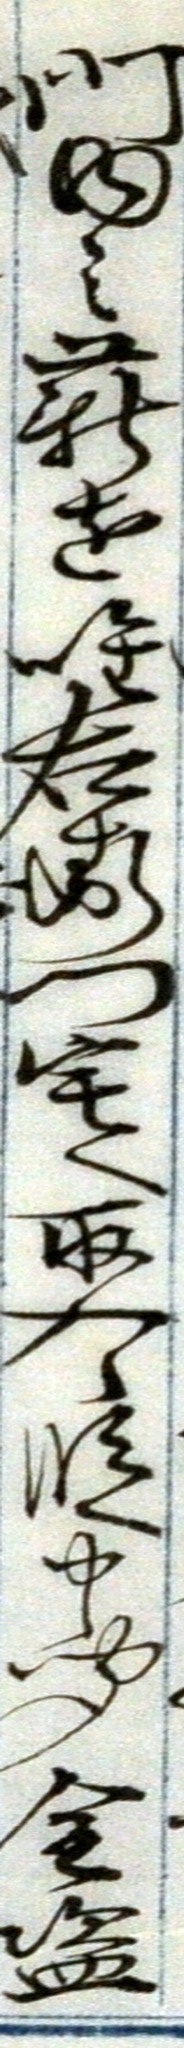門内之薪を唯右衛門宅へ取入候段申聞全盗賊
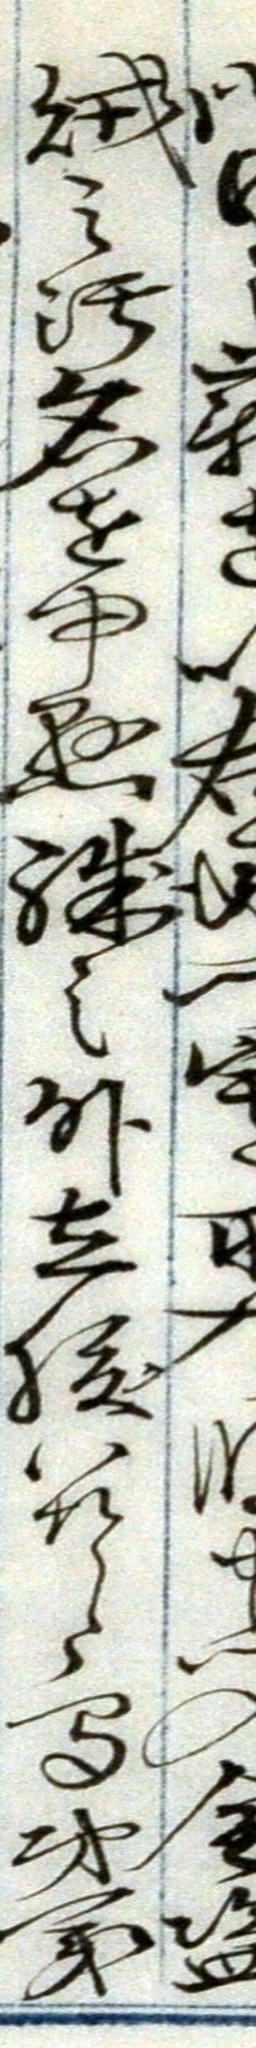賊之汚名を申懸殊之外立腹いたし候間弟義
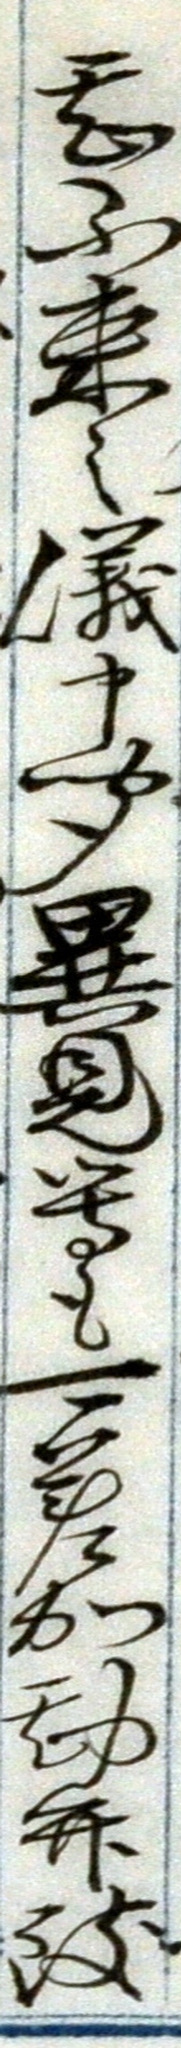甚不束之儀申聞異見等も可差加勘弁致
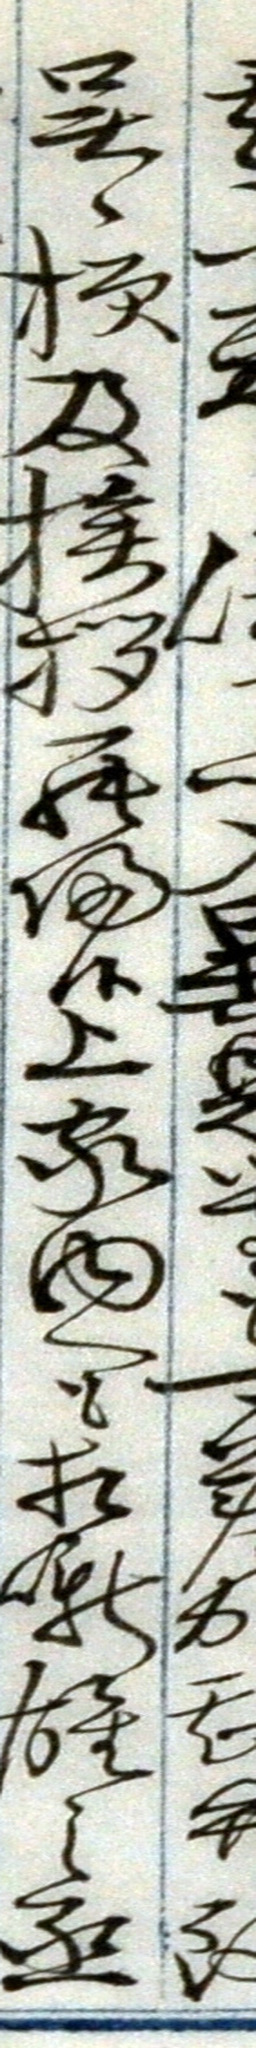呉候様及挨拶罷帰候上家内へも相噺雄之丞
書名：川面小藤太子細有之多賀谷唯右衛門ヲ打果候一件
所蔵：伊那市立高遠町図書館・合同会社AMANE
